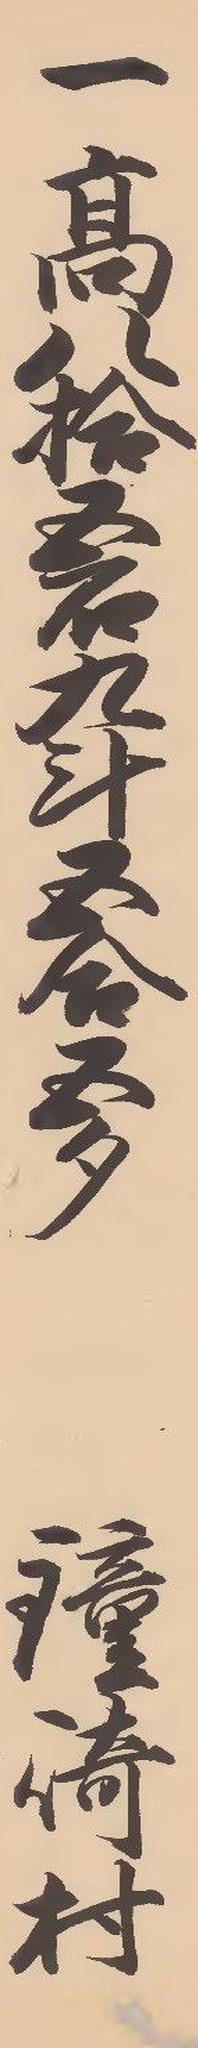一高八拾五石九斗五合五勺鐘崎村
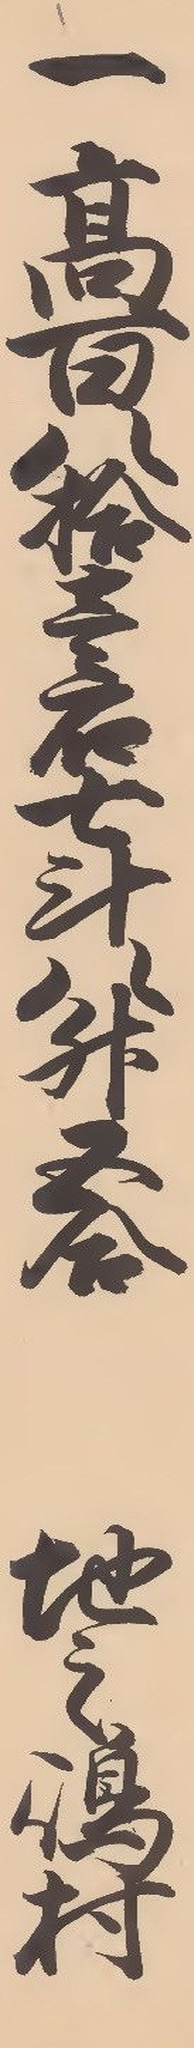一高百八拾壱石七斗八升五合地之島村

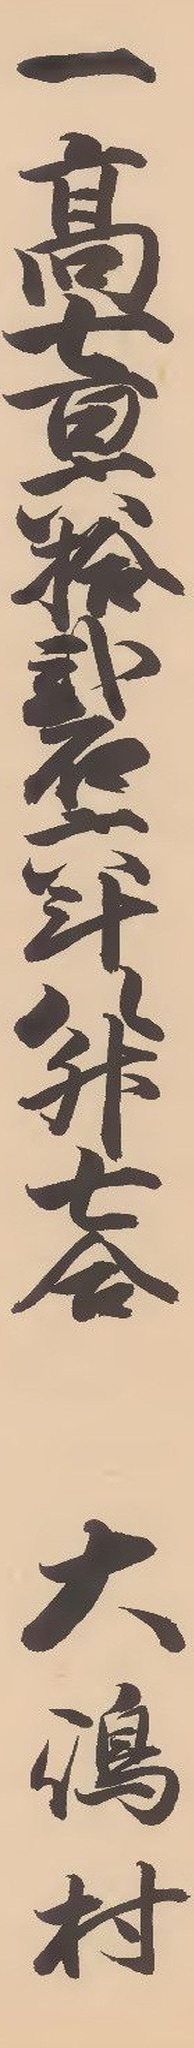一高七百六拾弐石六斗八升七合大島村
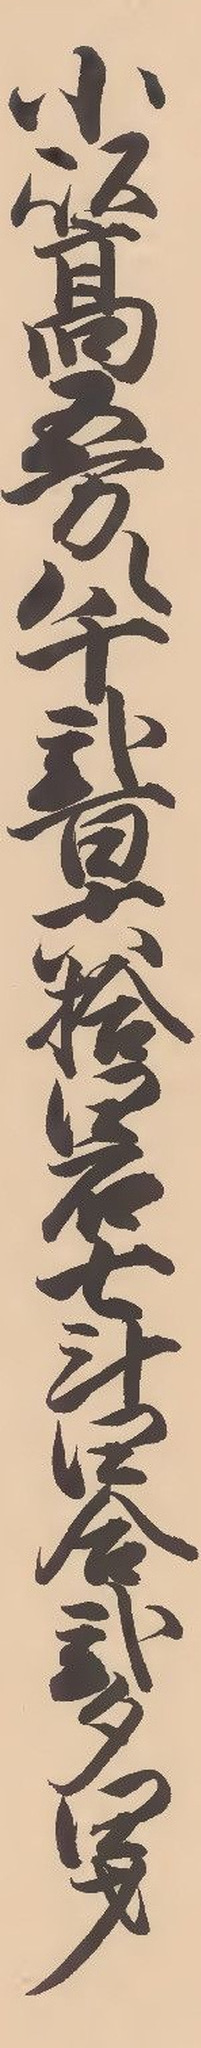小以高五万八千弐百六拾四石七斗四合弐勺四才
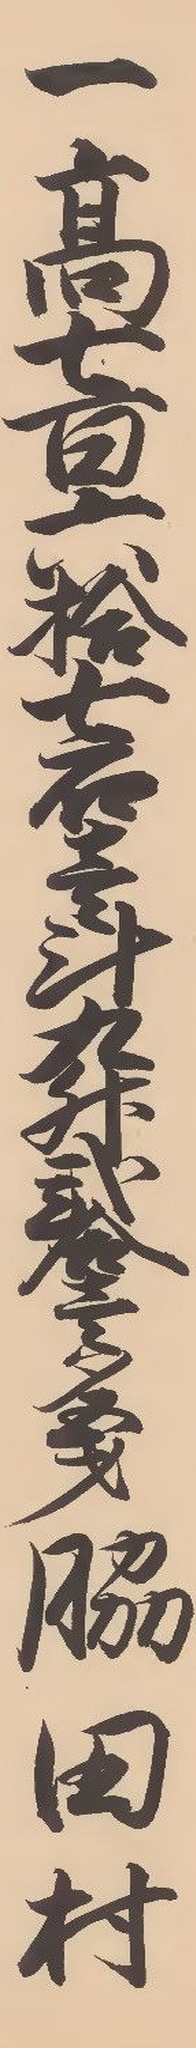一高七百六拾七石壱斗九升弐合壱勺五才脇田村
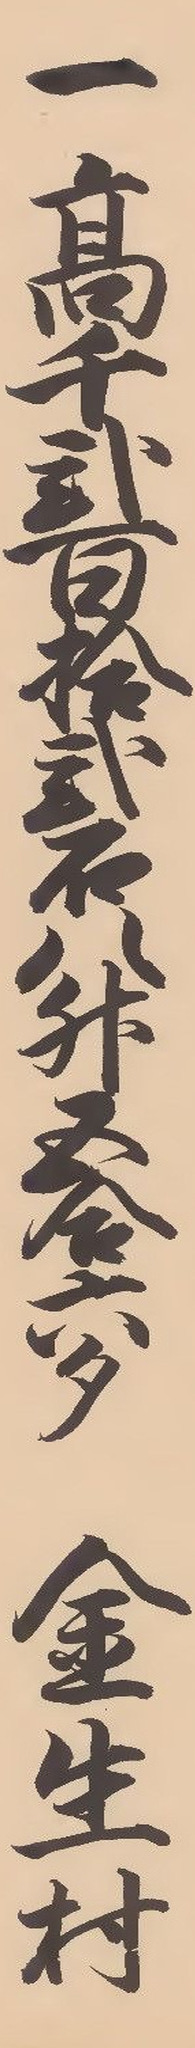一高千弐百拾弐石八升五合六勺金生村

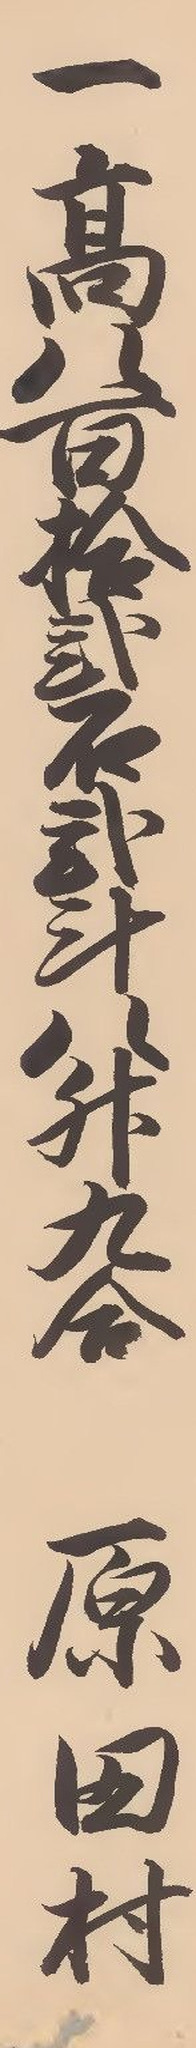一高八百拾弐石弐斗八升九合原田村
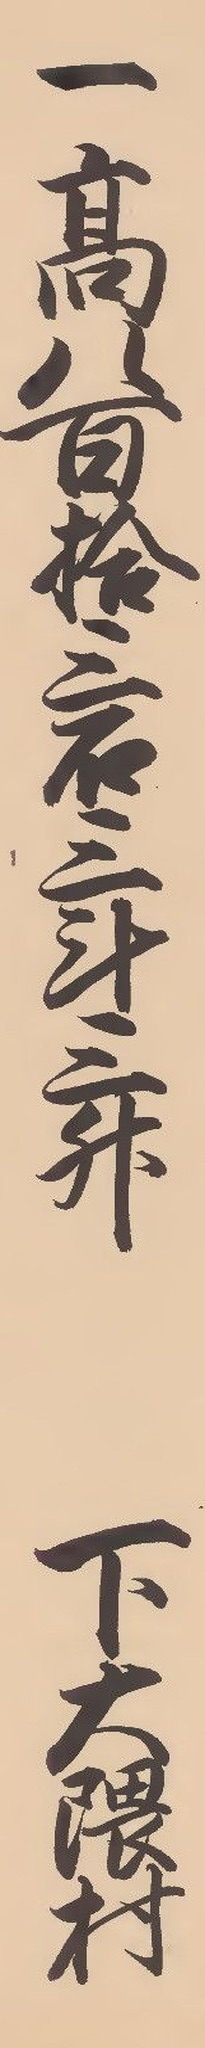一高八百拾三石三斗三升下大隈村
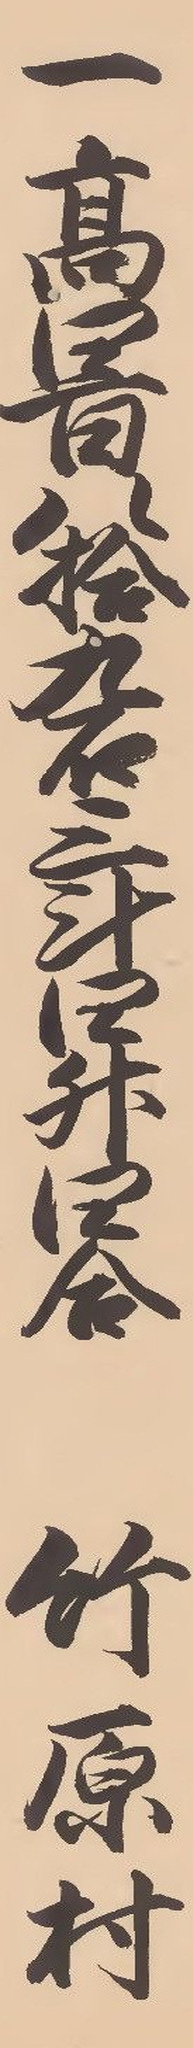一高四百八拾九石三斗四升四合竹原村
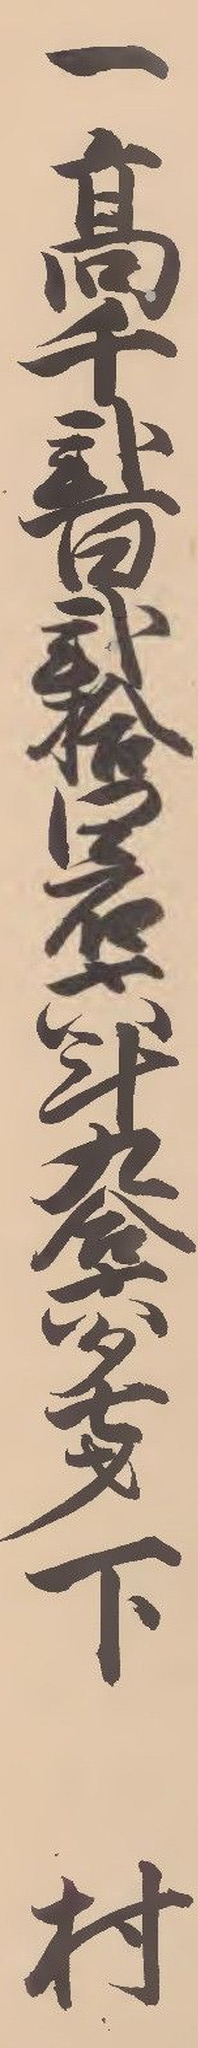一高千弐百弐拾四石六斗九合六勺七才下村
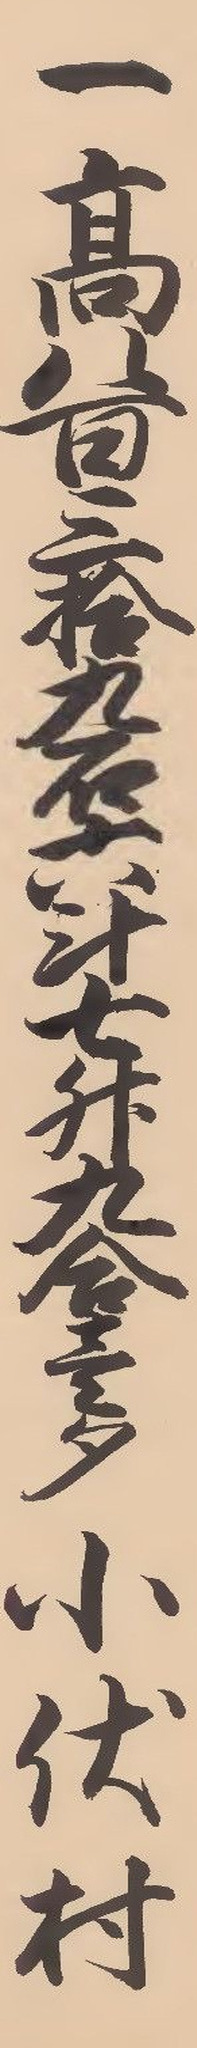一高八百三拾九石六斗七升九合壱勺小伏村
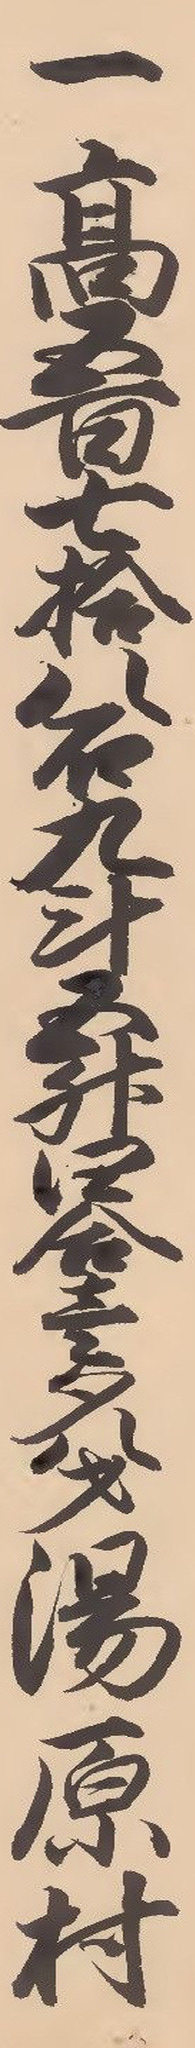一高五百七拾八石九斗五升四合壱勺八才湯原村

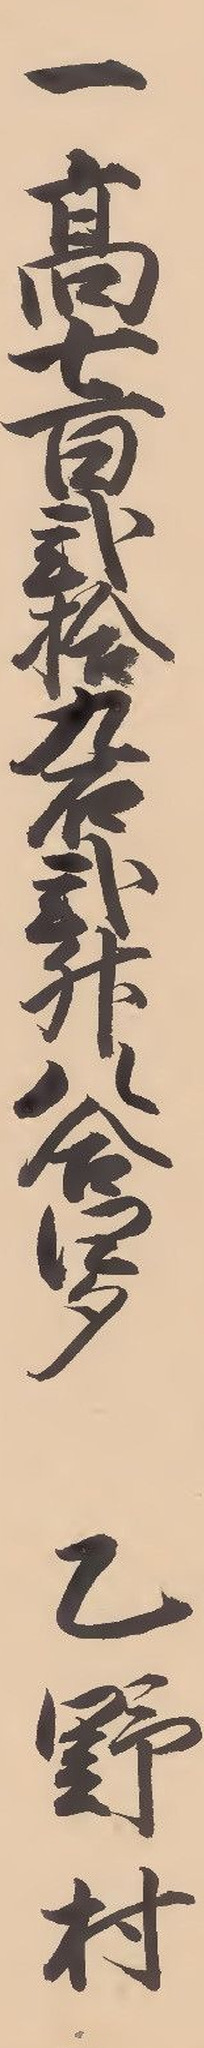一高七百弐拾九石弐升八合四勺乙野村
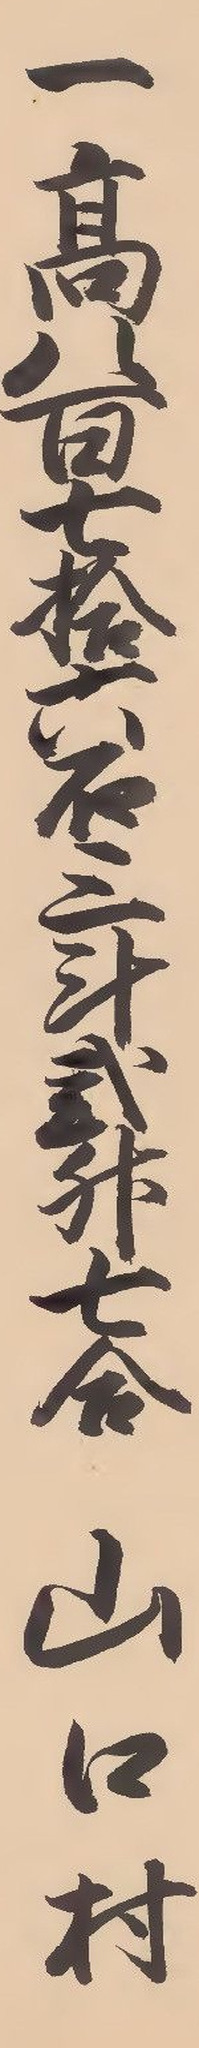一高八百七拾六石三斗弐升七合山口村
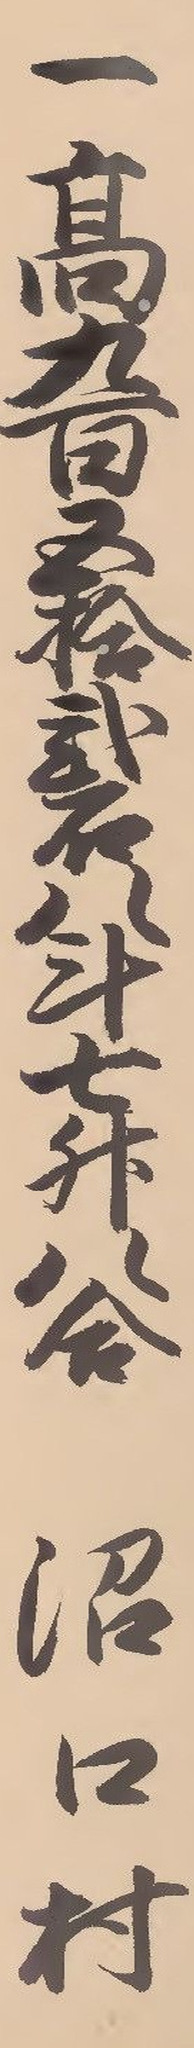一高九百五拾弐石八斗七升八合沼口村
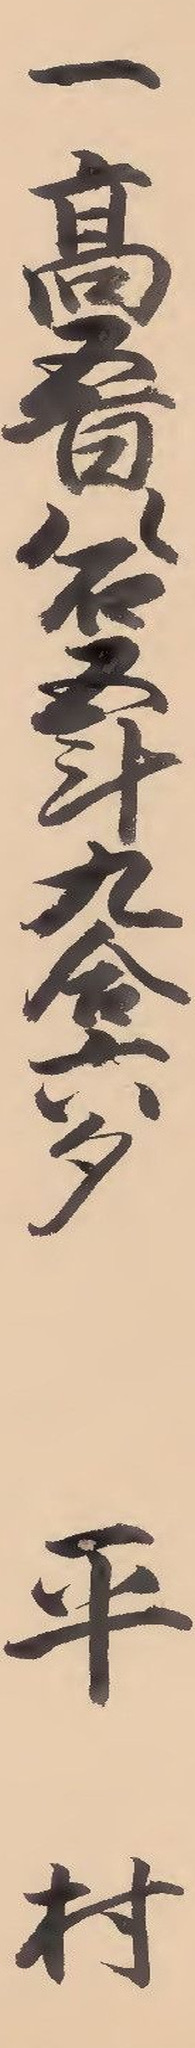一高五百八石五斗九合六勺平村
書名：筑前国郷帳
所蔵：国立公文書館 National Archives of Japan
